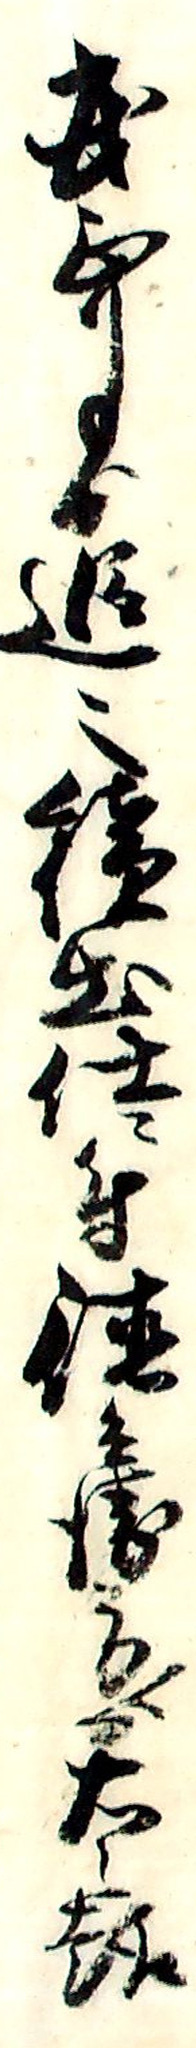當正月ゟ追々積出仕ニ付徳兵衛方ゟ右之趣
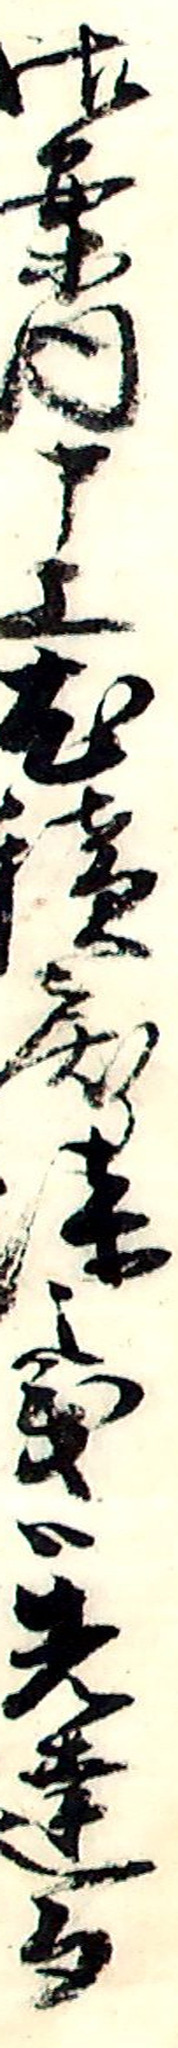御案内申上尤積戻り漆之義ハ先達而

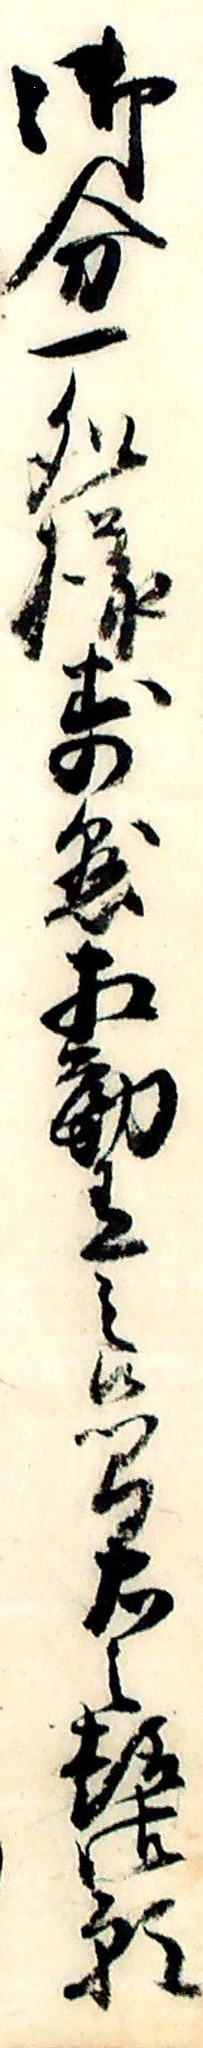御分一処様寄懸相勤有之候間右之趣御願
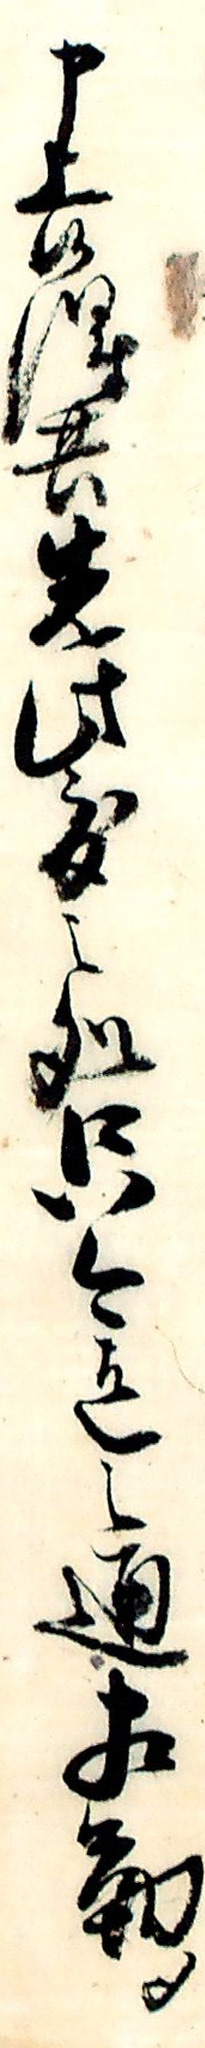申上候得共先此度之処只今迄之通相勤メ
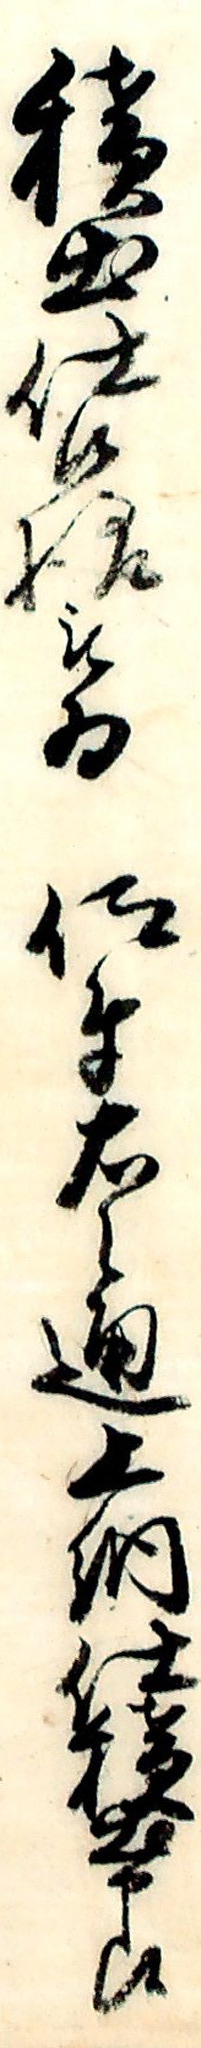積出仕候様被為仰付右之通上納仕積出申候
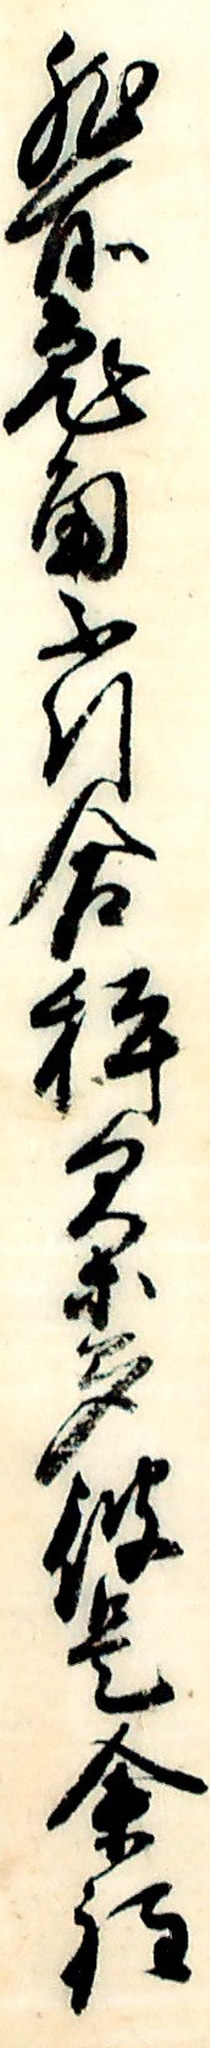然所兎角不引合秤欠等多彼是余程
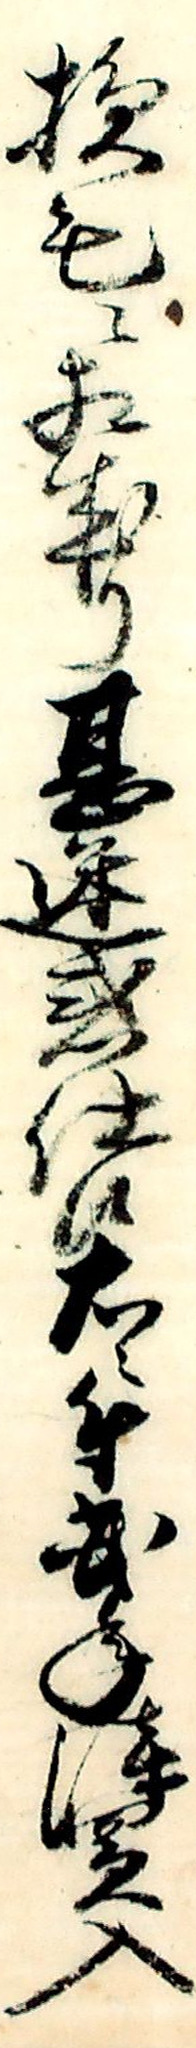損毛ニ相成り甚迷惑仕候右に付當年漆買入
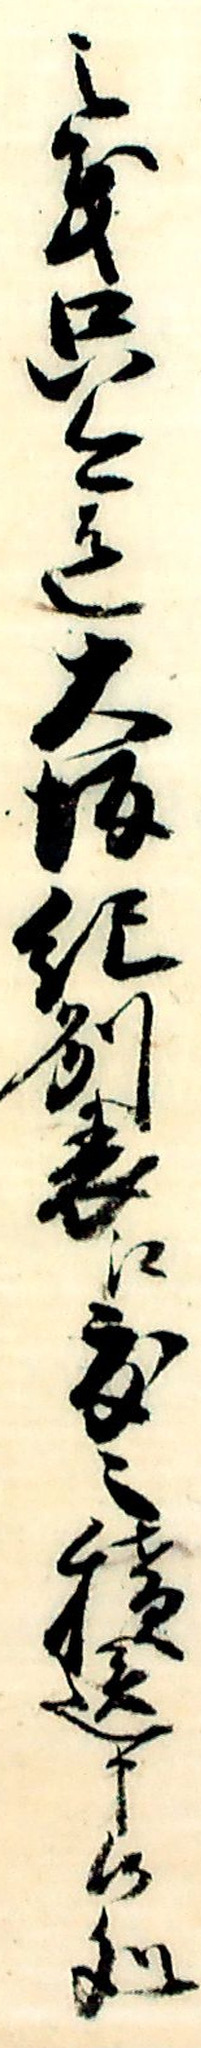之義只今迄大坂紀州表江度々積送申候処
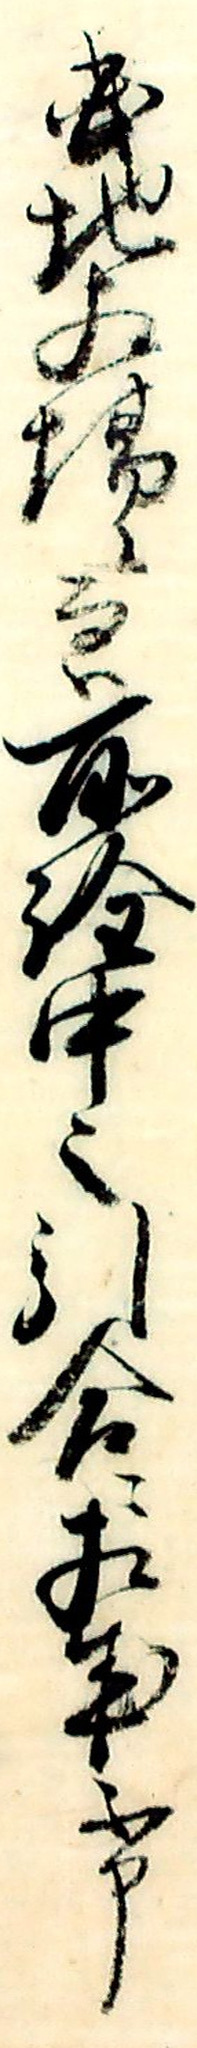當地相場ニ而ハ所詮中々引合ニ相成不申
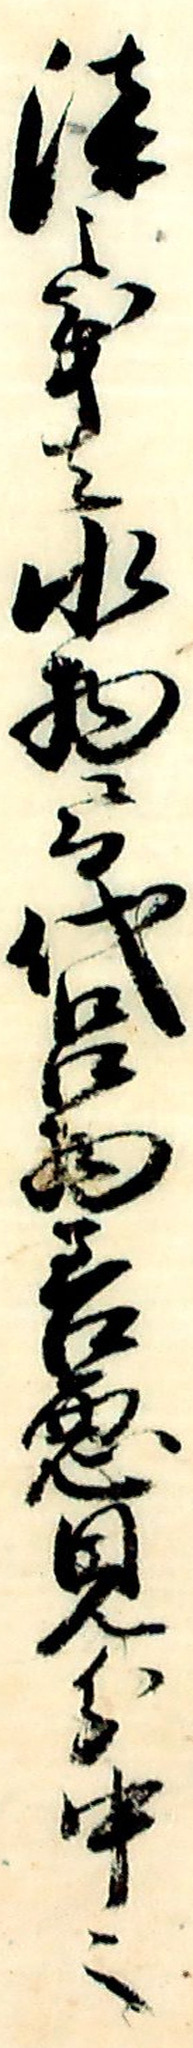漆之義者水物ニ而代品物善悪見分中々
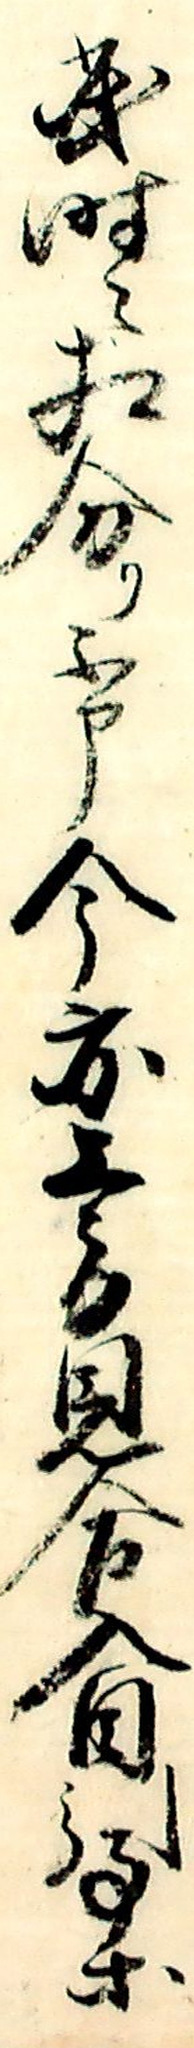當時ニ相分り不申今亦上方見合入目引事等
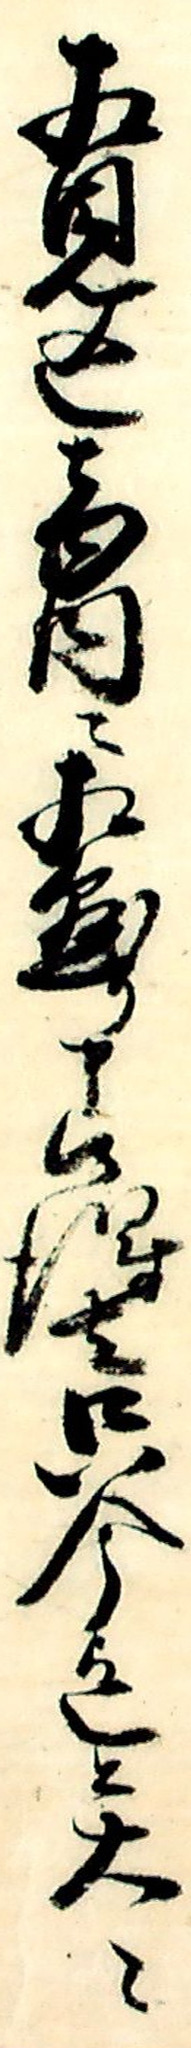相見込商内ニ相懸り申候得者只今迄と大ニ
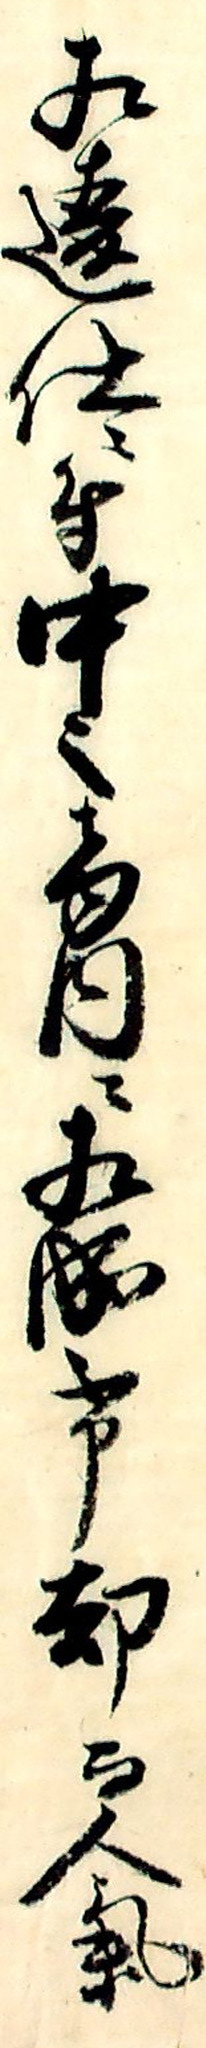相違仕ニ付中々商内ニ相成不申却而人気
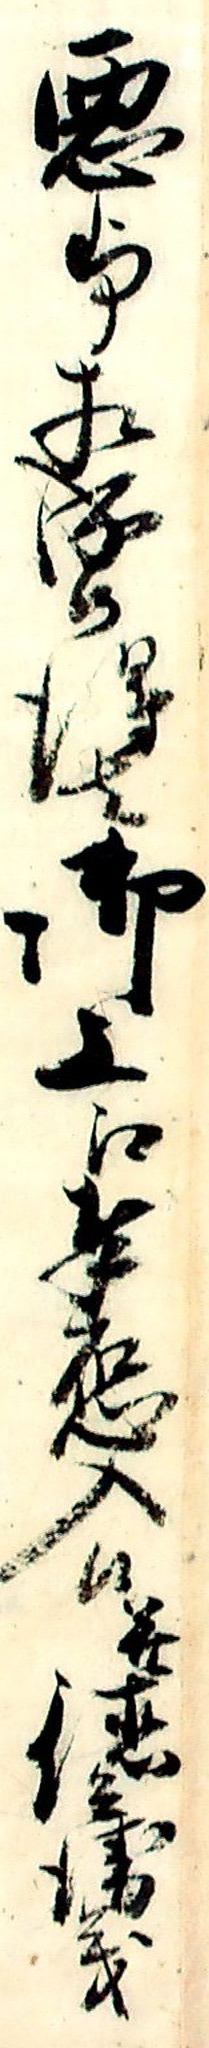悪布相成候得者御上江奉恐入候幷徳兵衛義
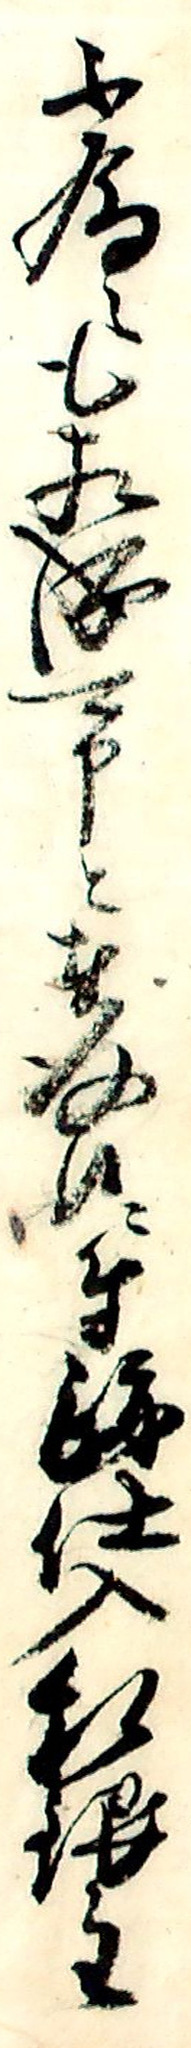不為ニも相成可申と奉存候ニ付跡仕入私銀主
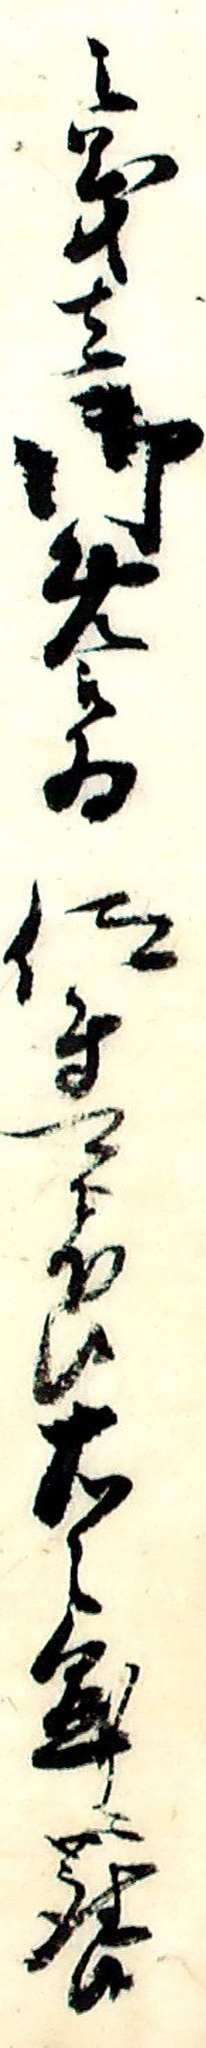之儀者御免被為仰付可被下候右之懸りニ御座候
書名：奉申上覚（山城谷漆仕入買入銀主之義に付）
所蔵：鳴門教育大学 Naruto University of Education
